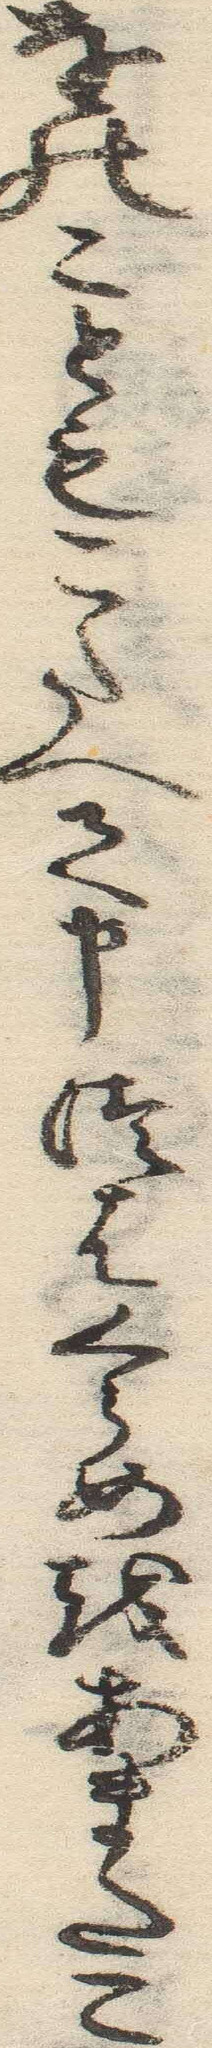をのこともこたへて申つはくらめをあまたこ
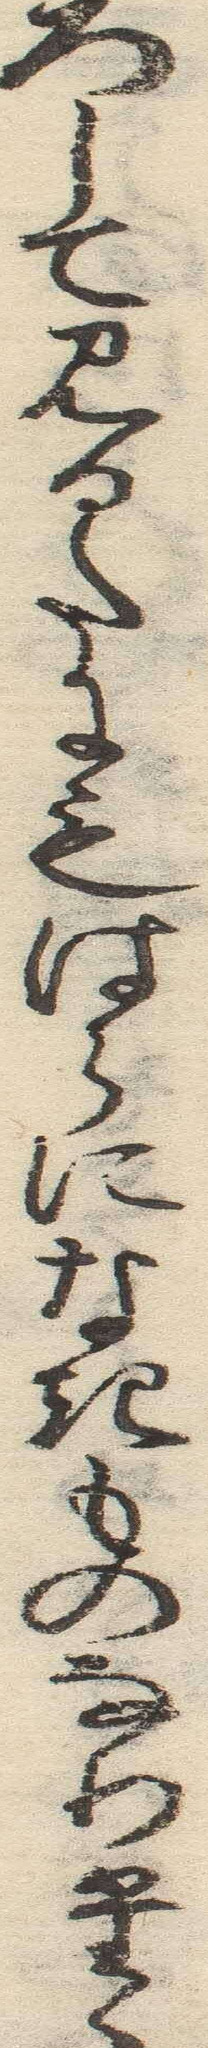ろして見るたにもはらになきものなりたゝ
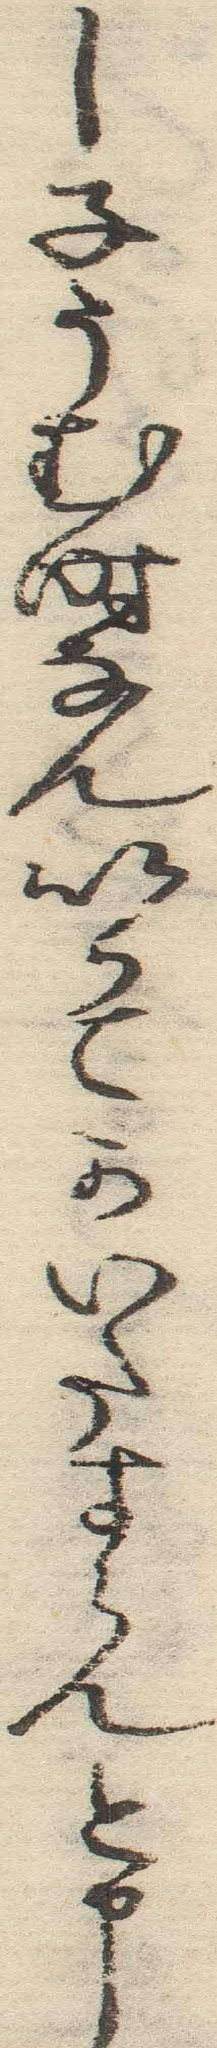し子うむ時なんいかてかいたすらんと申
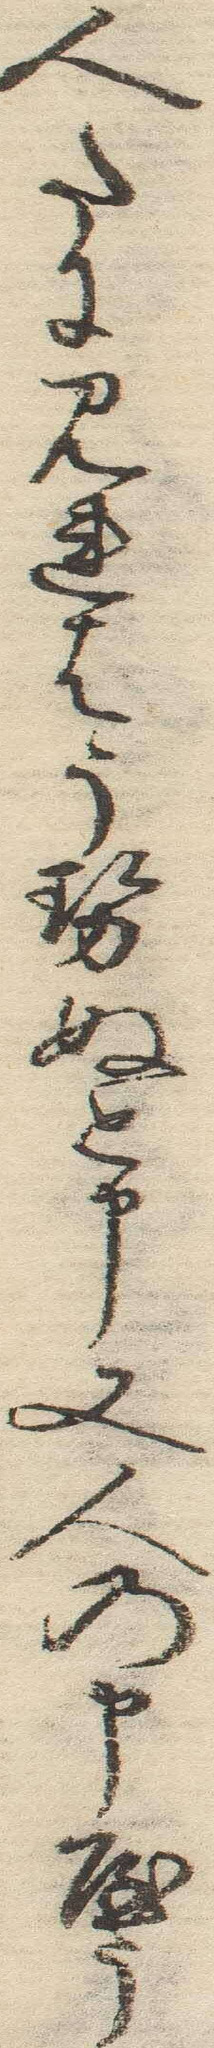人たに見れはうせぬと申又人の申やう
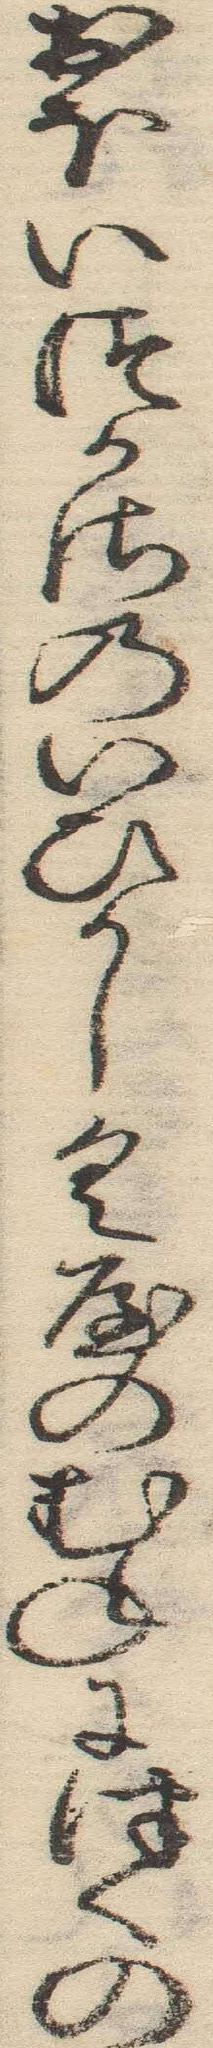おほいつかさのいひかしく屋のむねにつくの

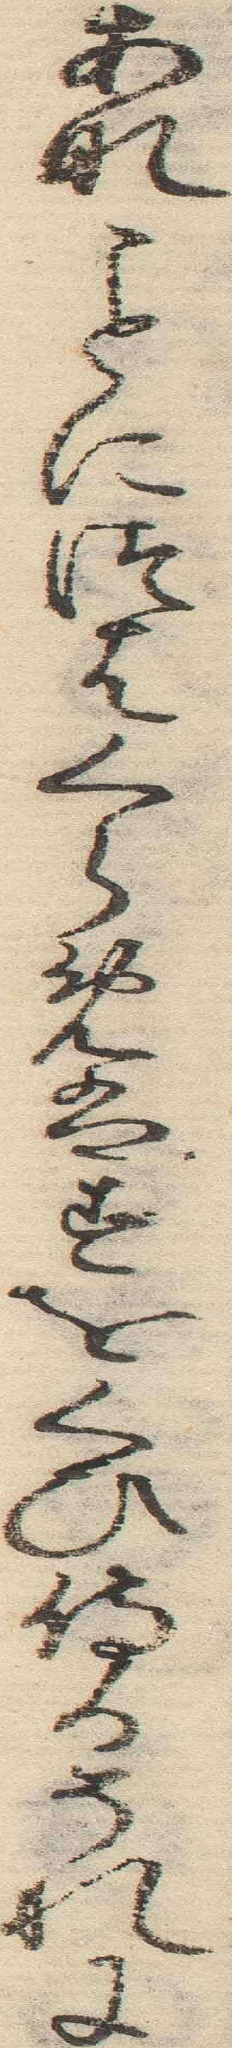あなことにつはくらめはすをくひ侍るそれに
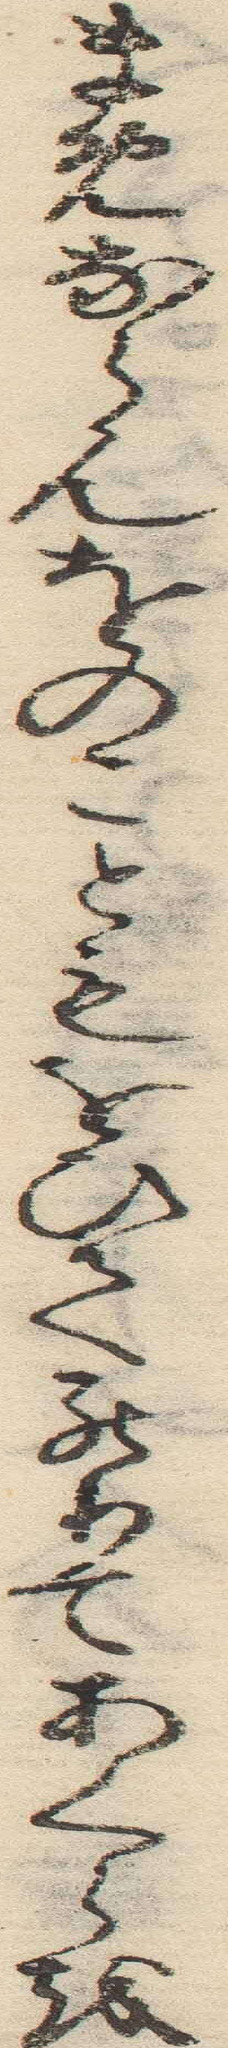まめならんをのこともをひて罷りてあくらを
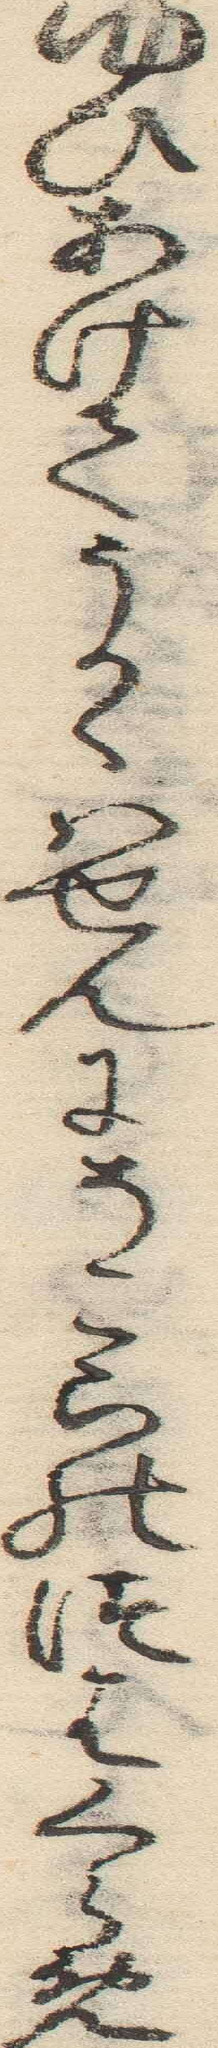ゆひあけてうかゝはせんにそこらのつはくらめ
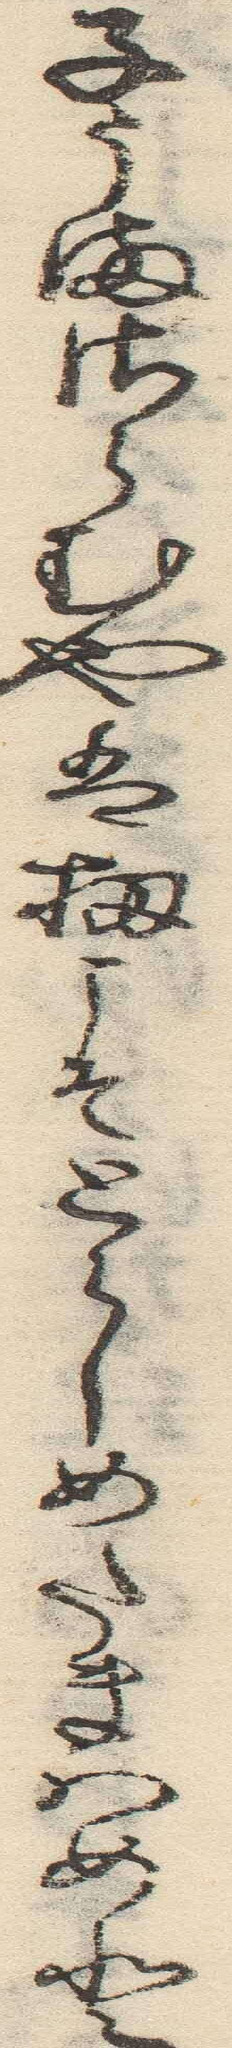子うまさらむやは扨こそとらしめたまはめと
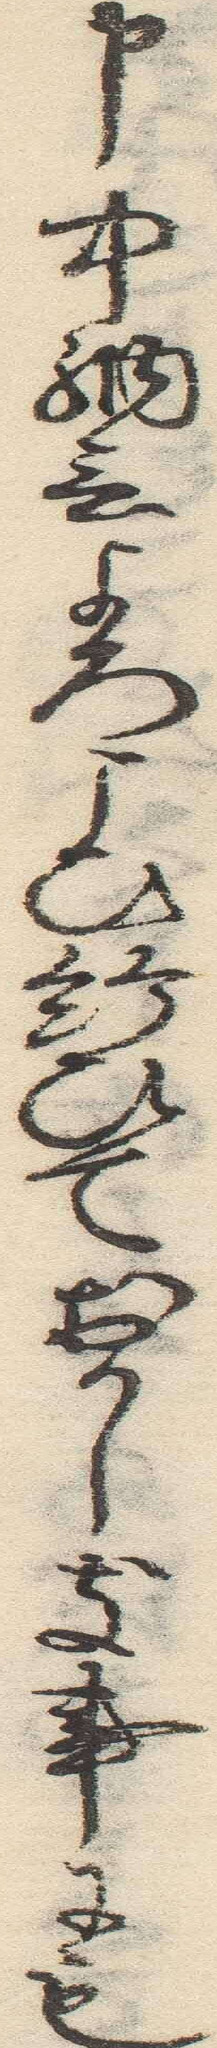申中納言よろこひ給ひておかしき事にも
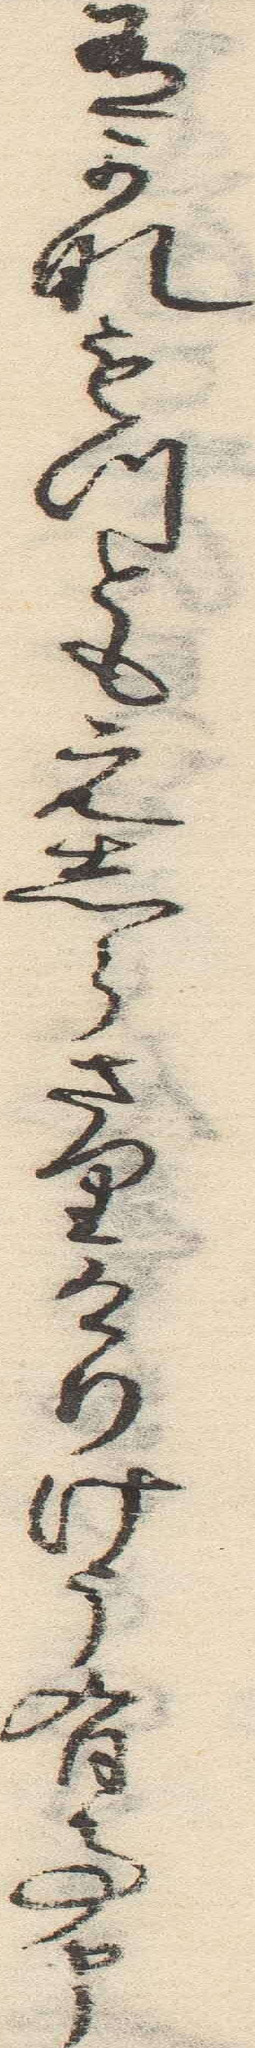有かなもつともえしらさりけりけう有事申
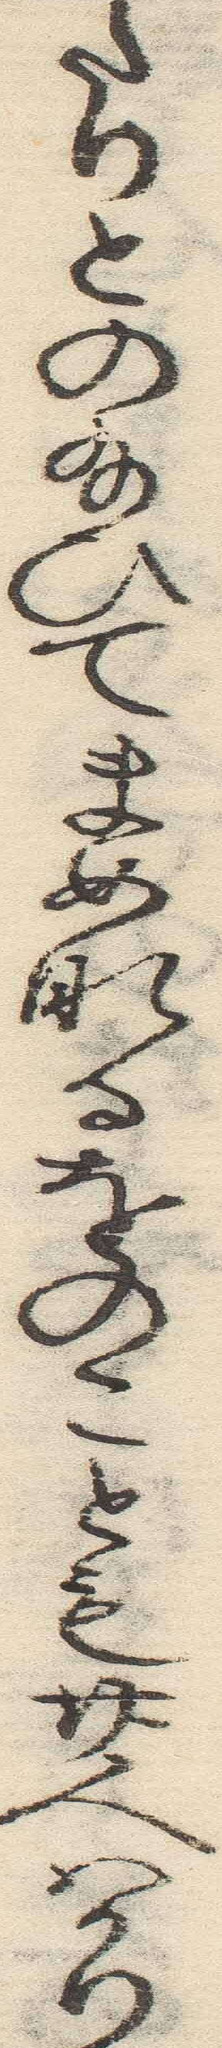たりとの給ひてまめなるをのことも廿人はかり
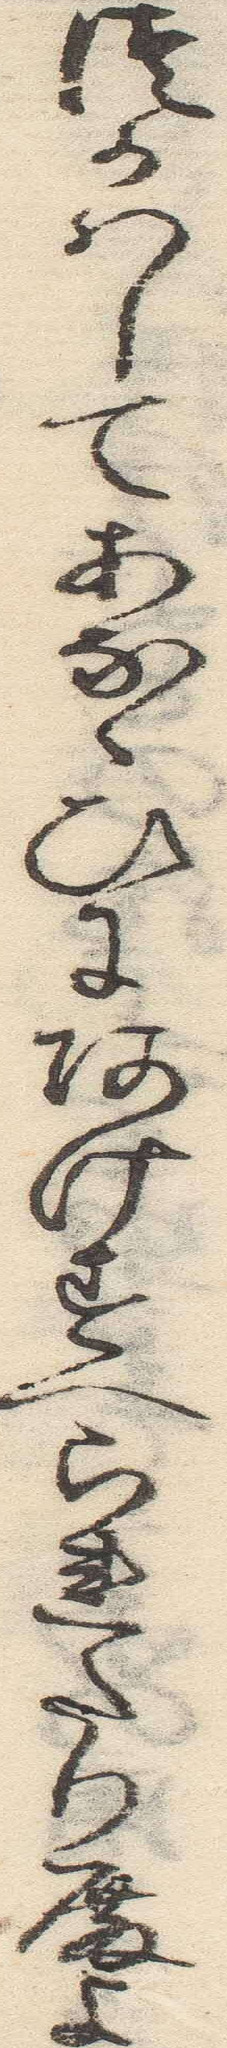つかはしてあなゝひにあけすへられたり殿よ
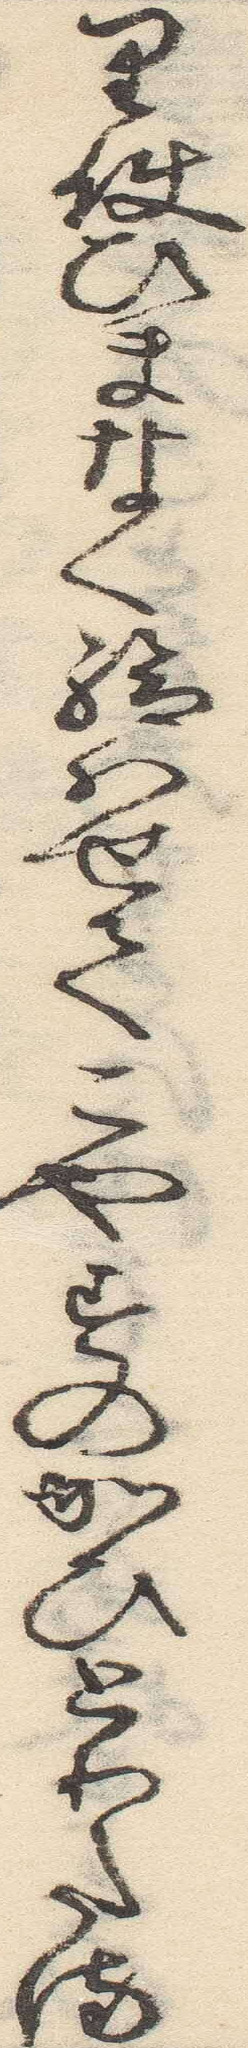り使ひまなく給はせてこやすのかひとりたる
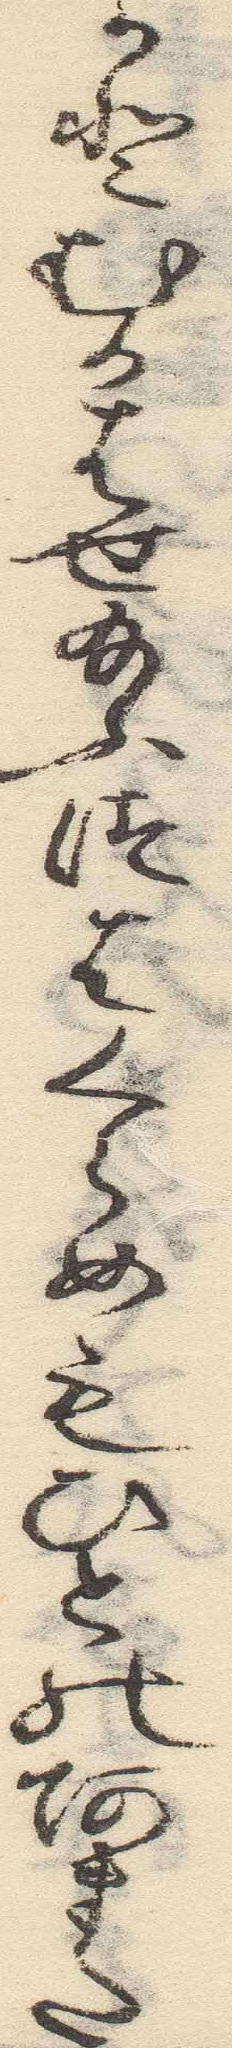かとむかはせ給ふつはくらめもひとのあまた
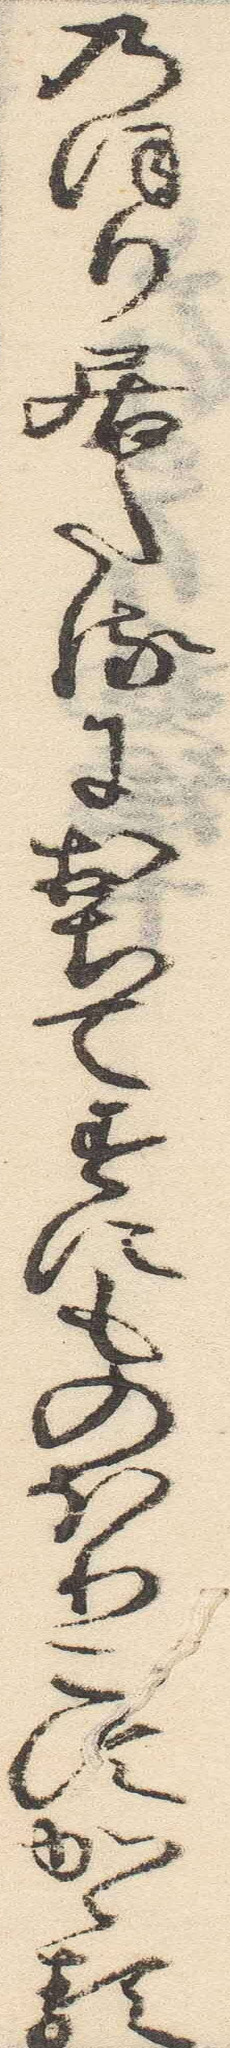のほり居たるにおちてすにものほりこすかゝる
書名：竹取物語
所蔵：東京学芸大学附属図書館 国文学研究資料館
